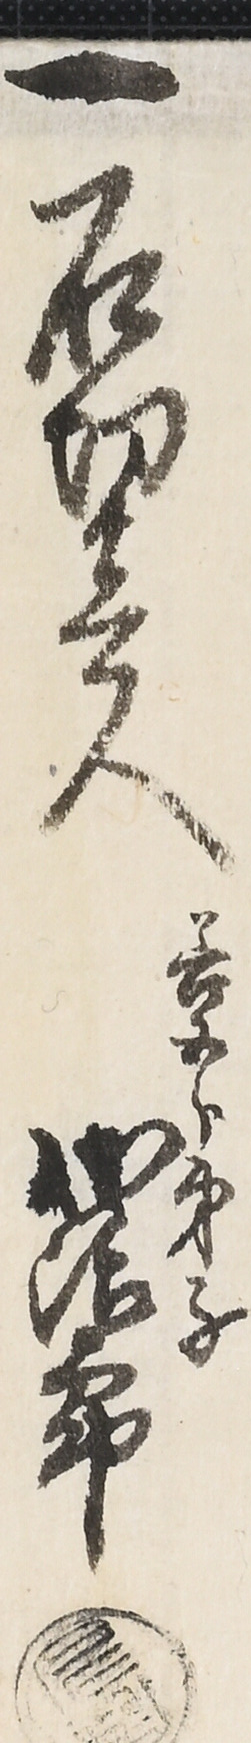一石切壱人芳松㊞
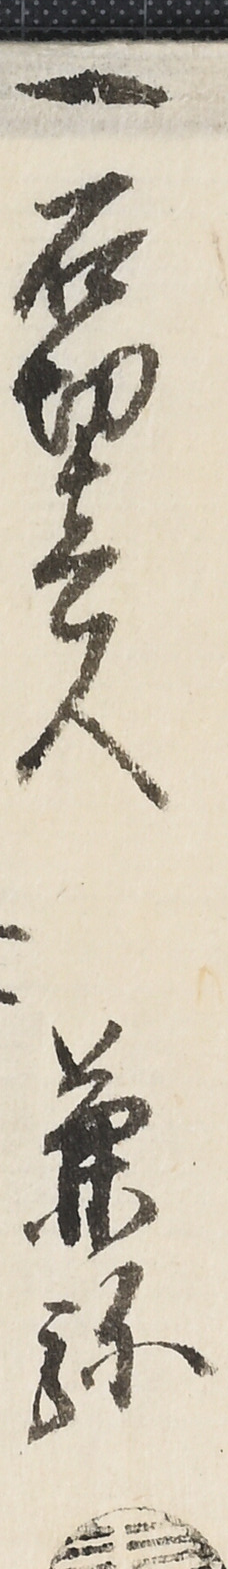一石切壱人兼弥㊞
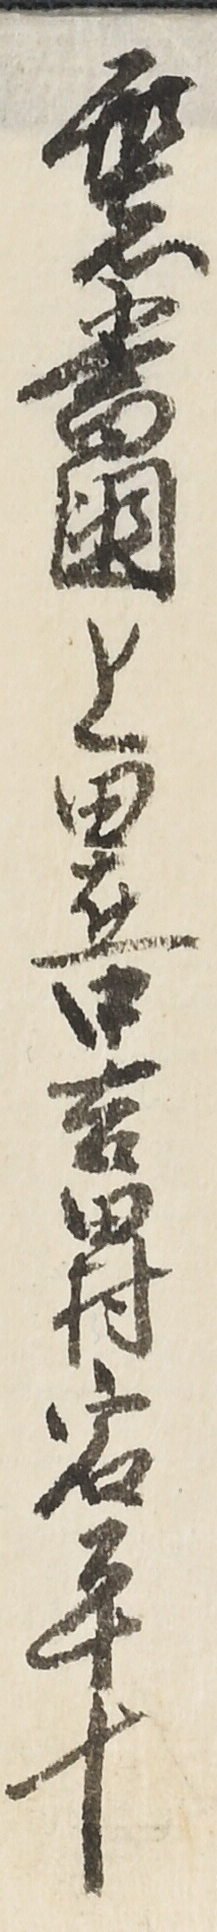此者当国上田在中吉田村宿平十
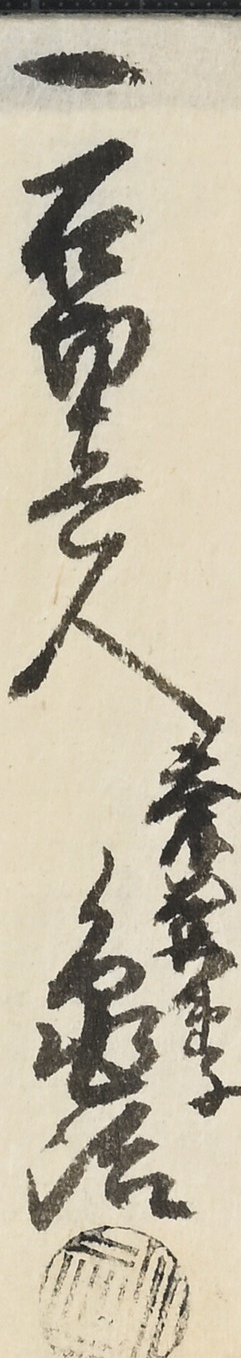一石切壱人芳松㊞

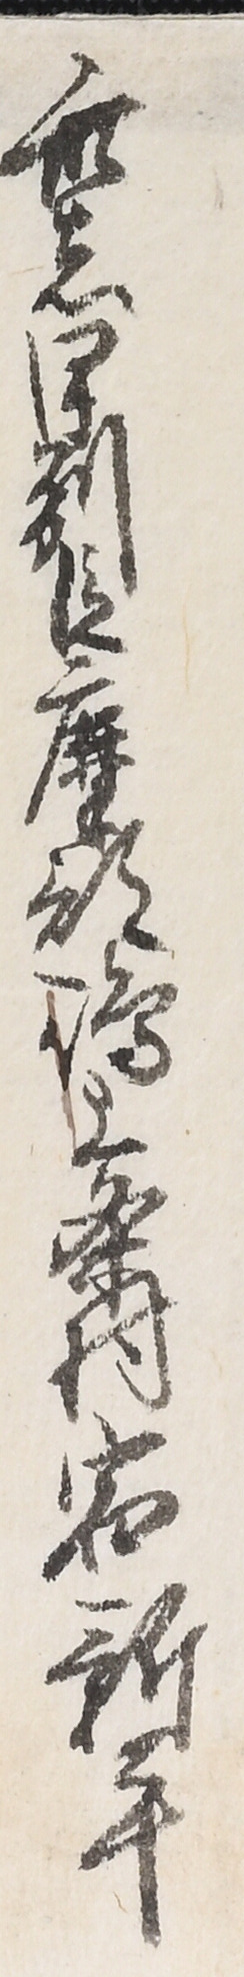此者甲州巨摩郡島上条村宿新平
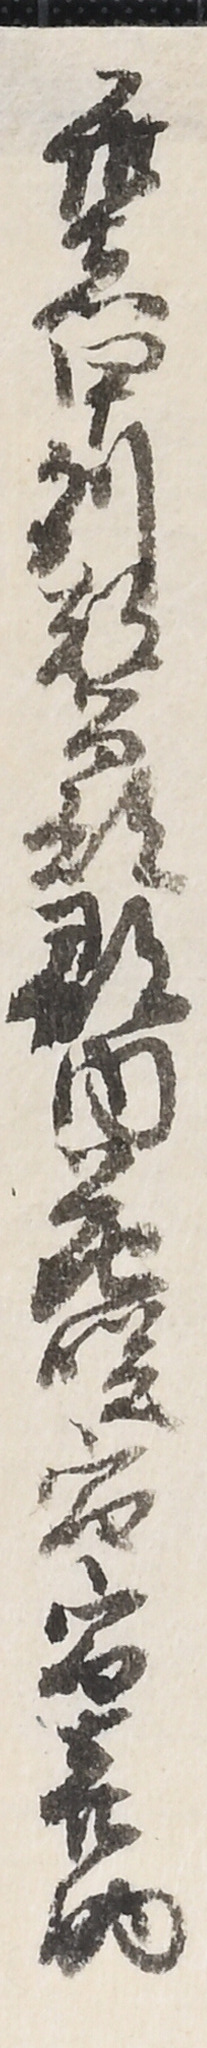此者都留郡郡内花咲宿宿喜助

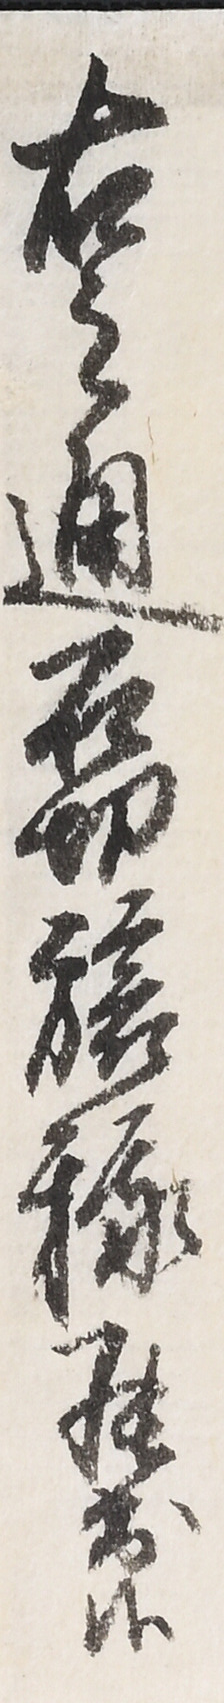右之通石切旅稼罷出候
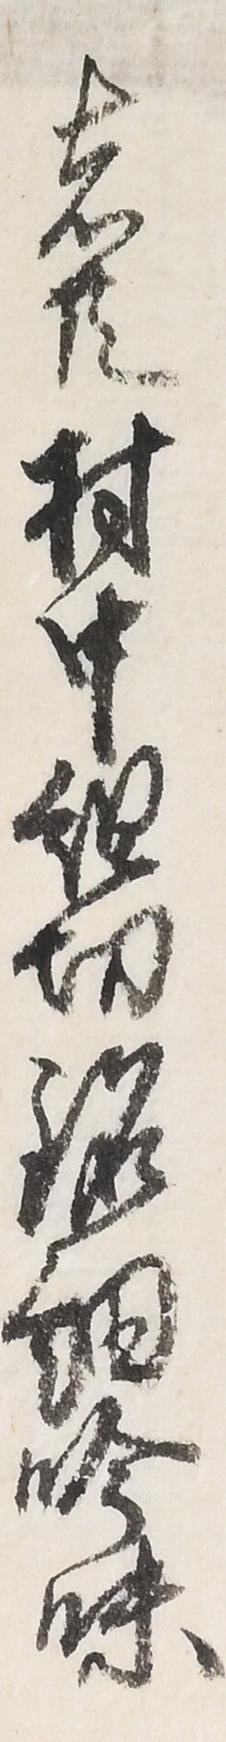者共村中組切銘細吟味
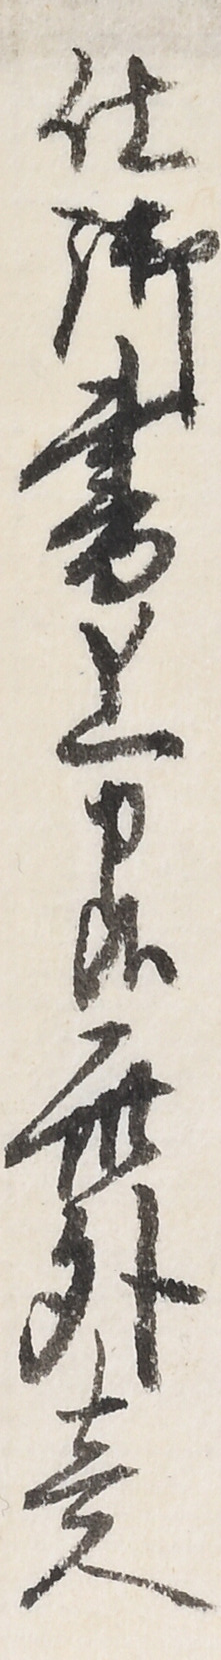仕御書上申候此外壱人
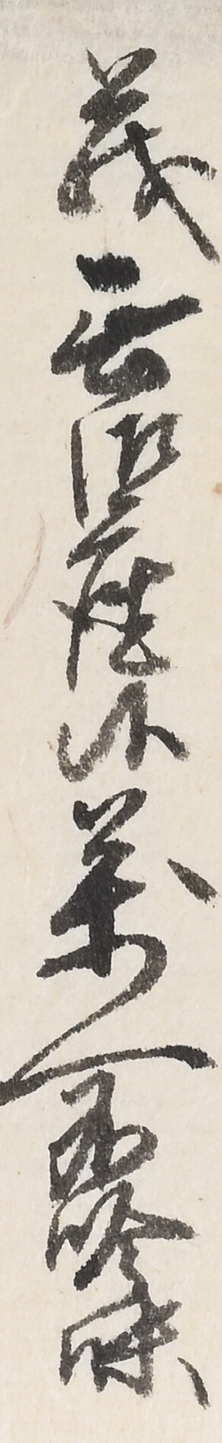も無御座候万一不吟味
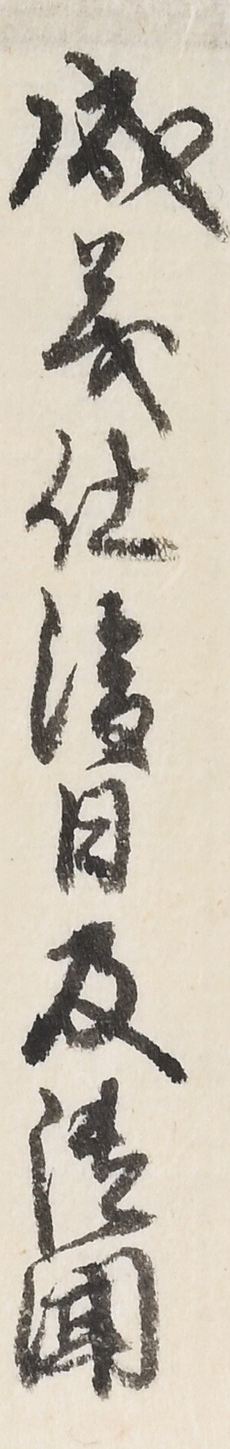成義仕後日及御聞
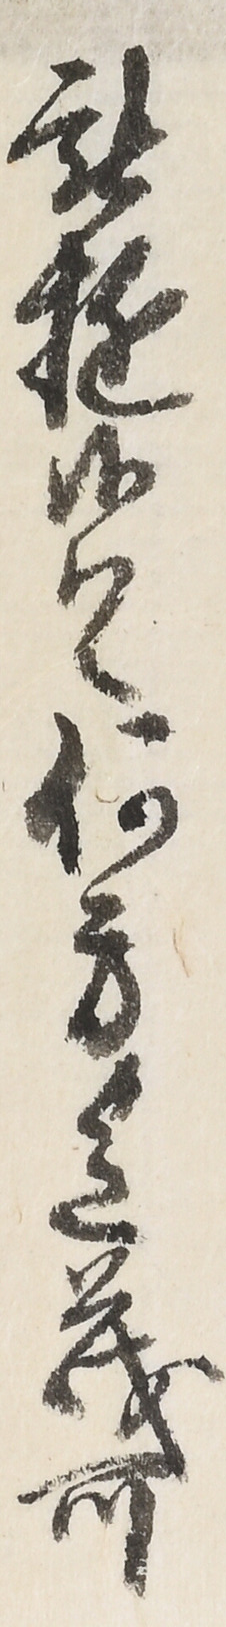被遊候ハヽ何方迄も可
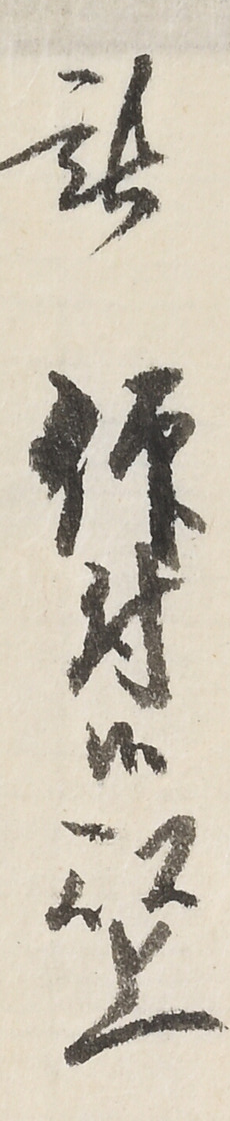被仰付候以上
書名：安政七庚申年正月他國出石切名前書上帳
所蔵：伊那市立高遠町図書館・合同会社AMANE
